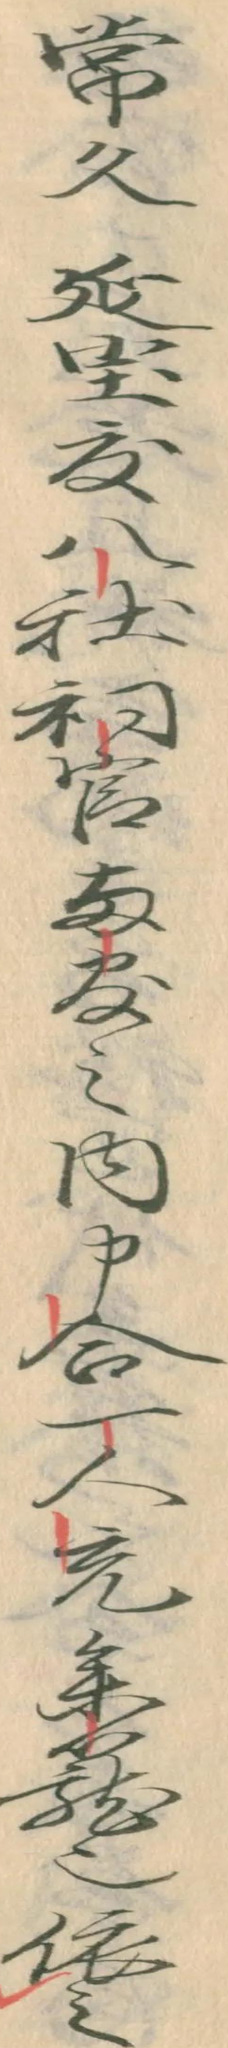常久延宝度八-社祠-官両-官之内申_合一-人_充参-籠也依之
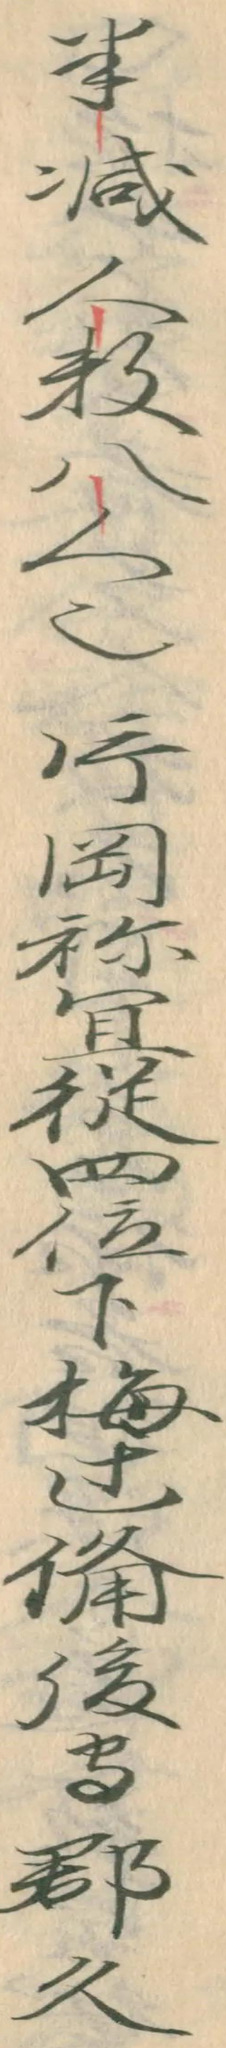半-減人-数八-人也片岡祢宜従四位下梅辻備後守郡久
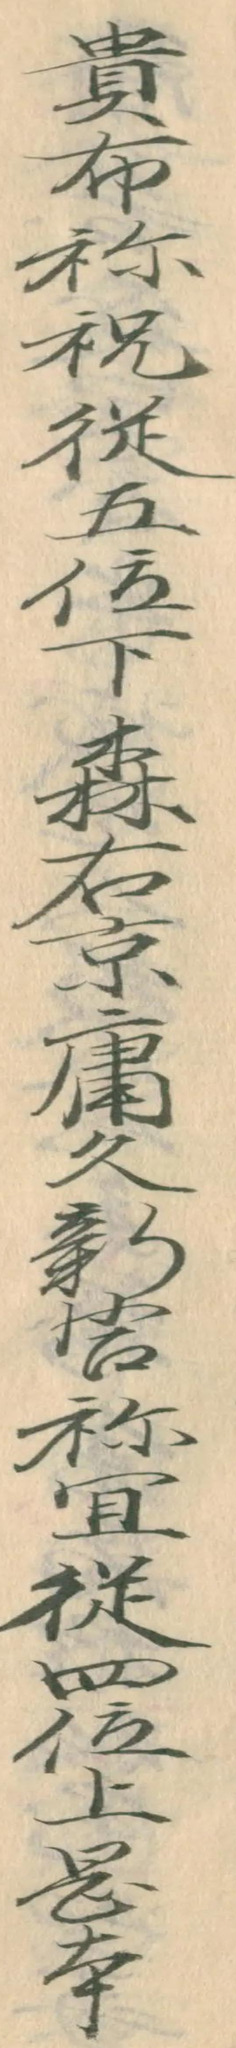貴布祢祝従五位下森右京庸久新宮祢宜従四位上岡本
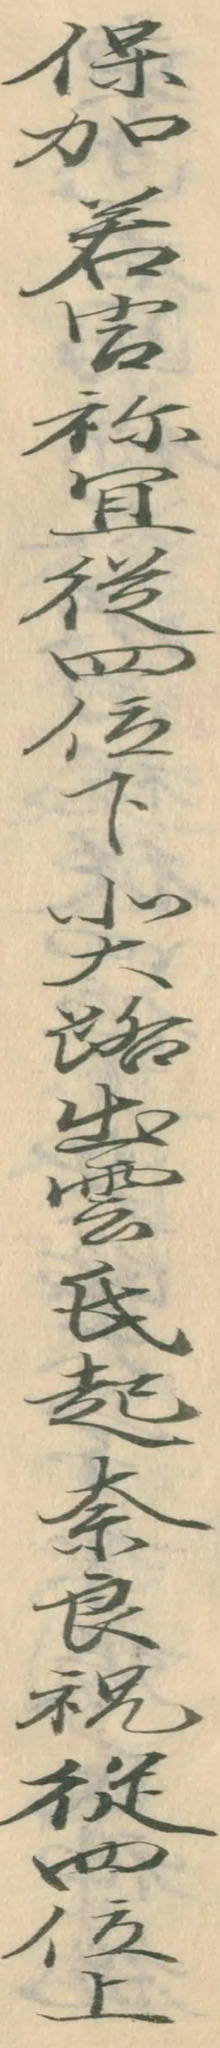保加若宮祢宜従四位下北大路出雲氏起奈良祝従四位上

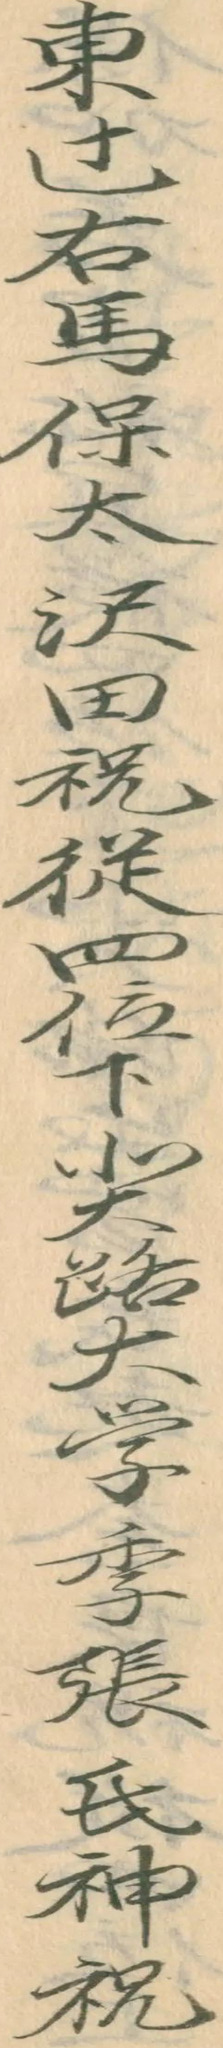東辻右馬保太沢田祝従四位下北大路大学季張氏神祝
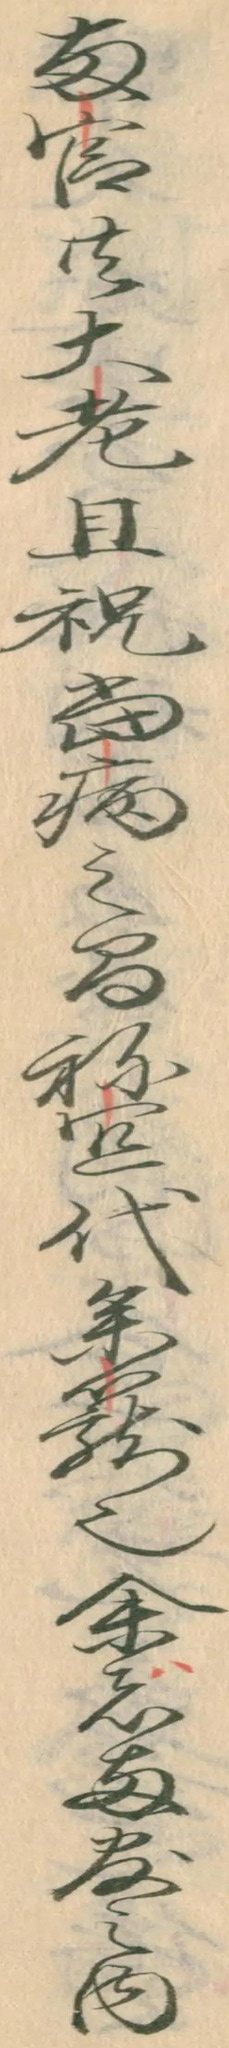両-官共大-老且祝当-病之間祢-宜代参-籠也余者両官之内
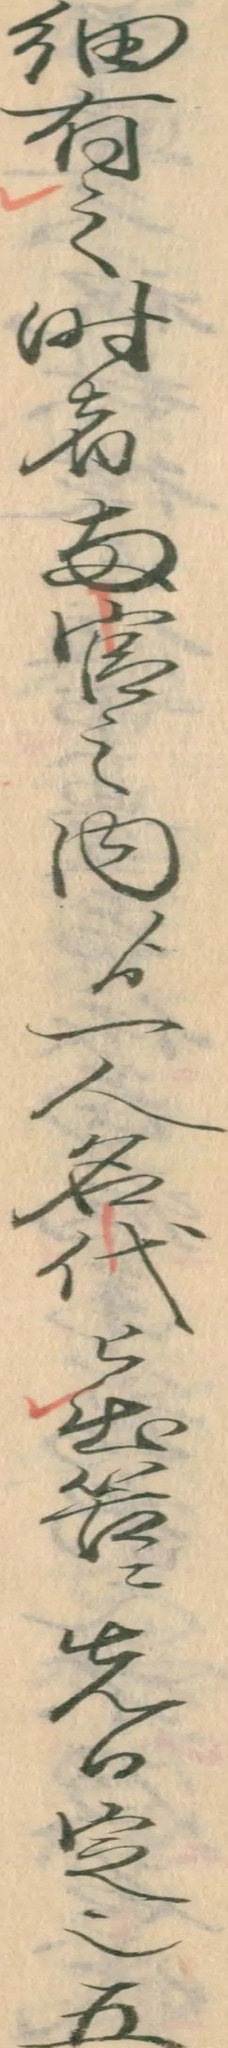細有之時者両-官之内ゟ一人名-代被出筈ニ先日定也五
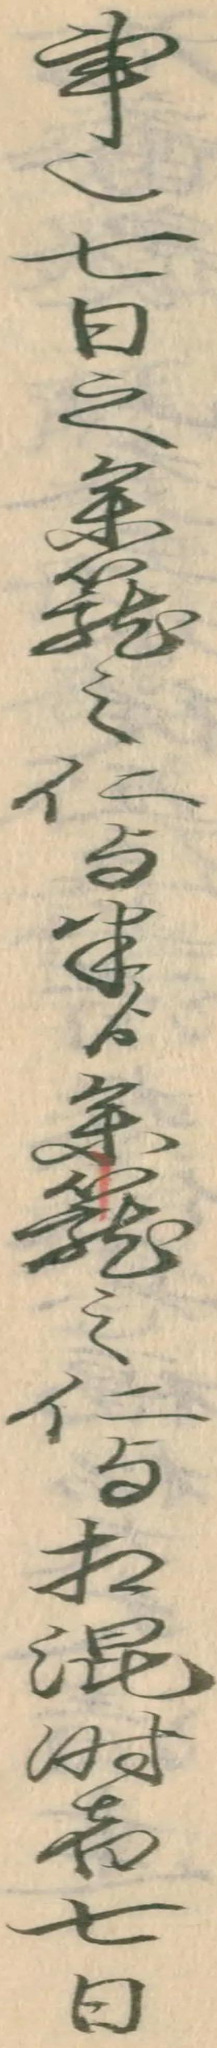事也七日之参籠之仁与半ゟ参-籠之仁与相混時者七日
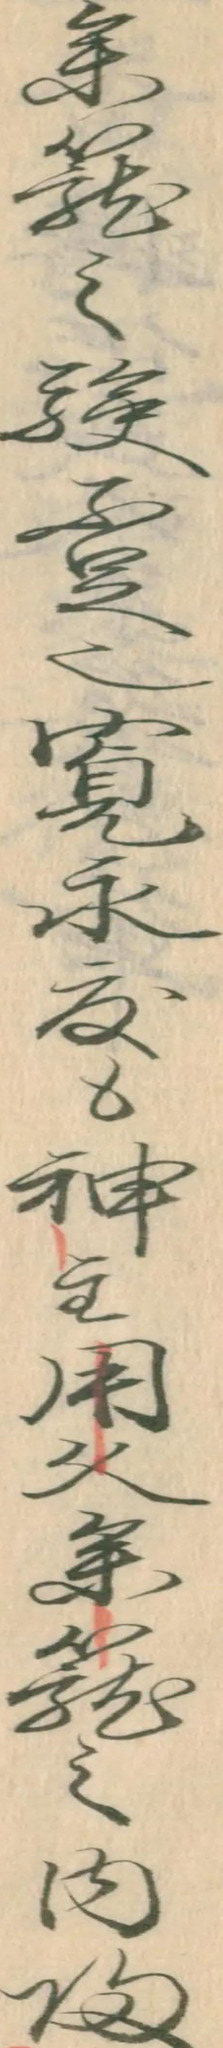参籠之験不足也寛永度も神_主用久参-籠之内帰

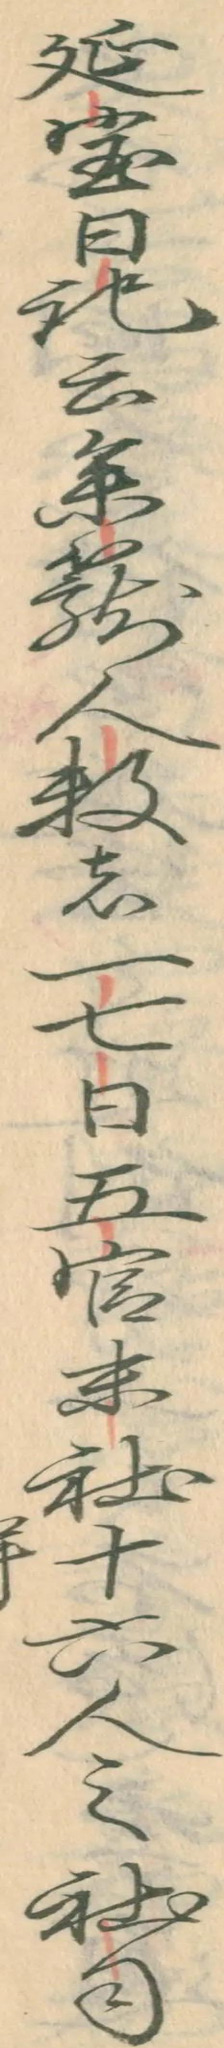延-宝日-記云参-籠人-数者一-七-日五-官末-社十六人之社-司
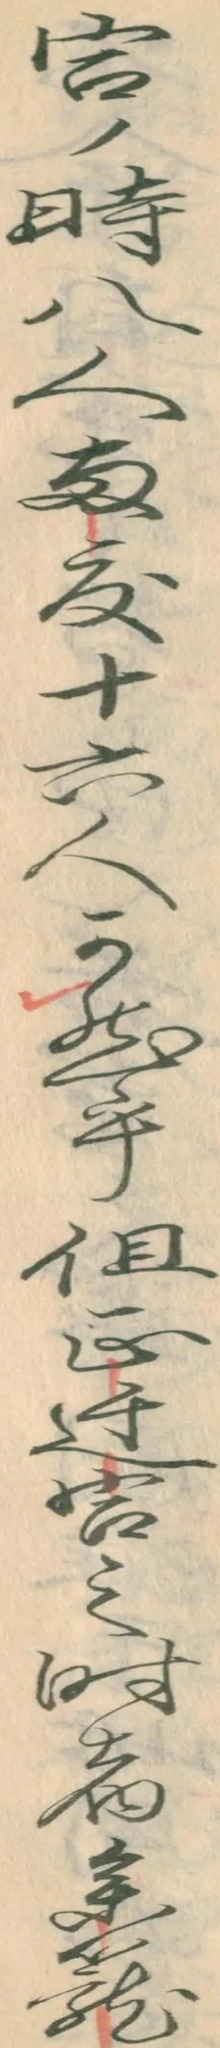宮ノ時八人両-度十六人可然乎但正-迁-宮之時者参-籠-
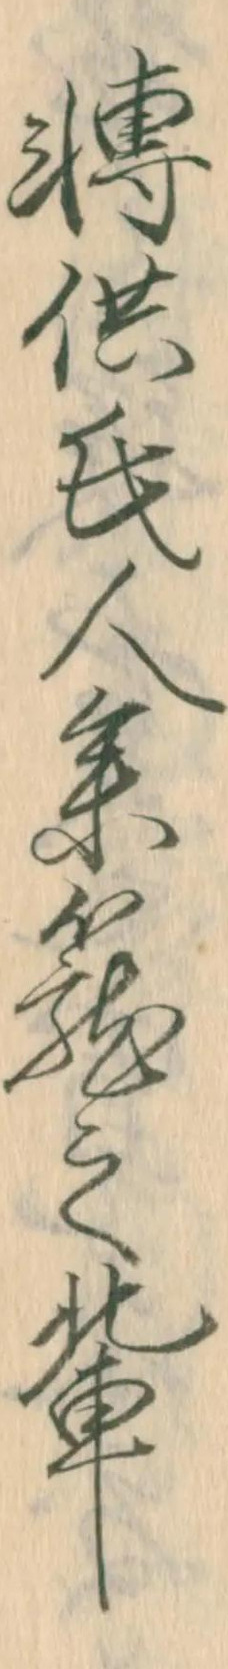転供氏人参籠之輩
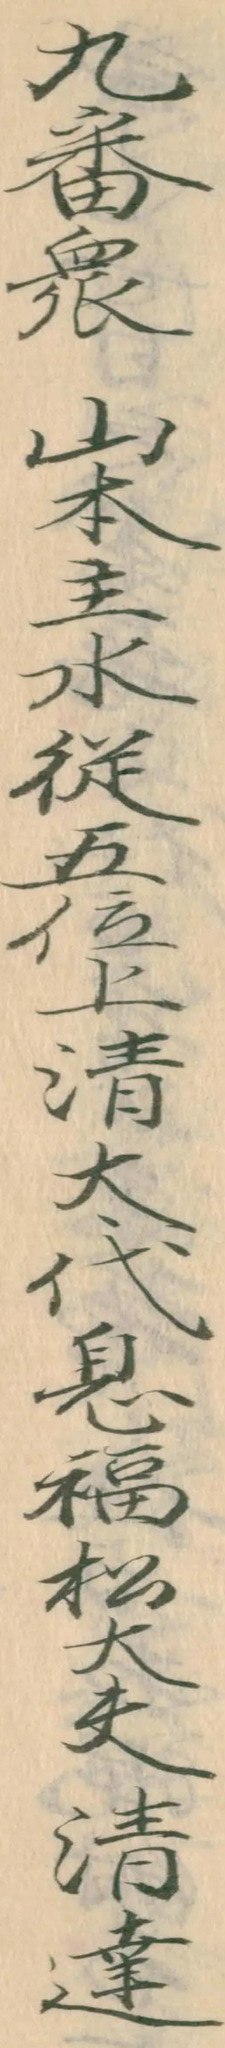九番衆山本主水従五位上清太代息福松大夫清達
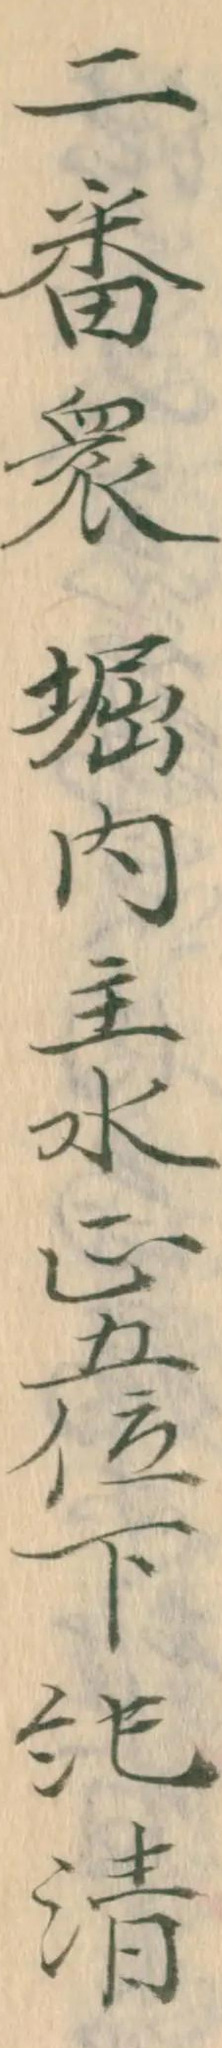二番衆堀内主水正五位下紀清
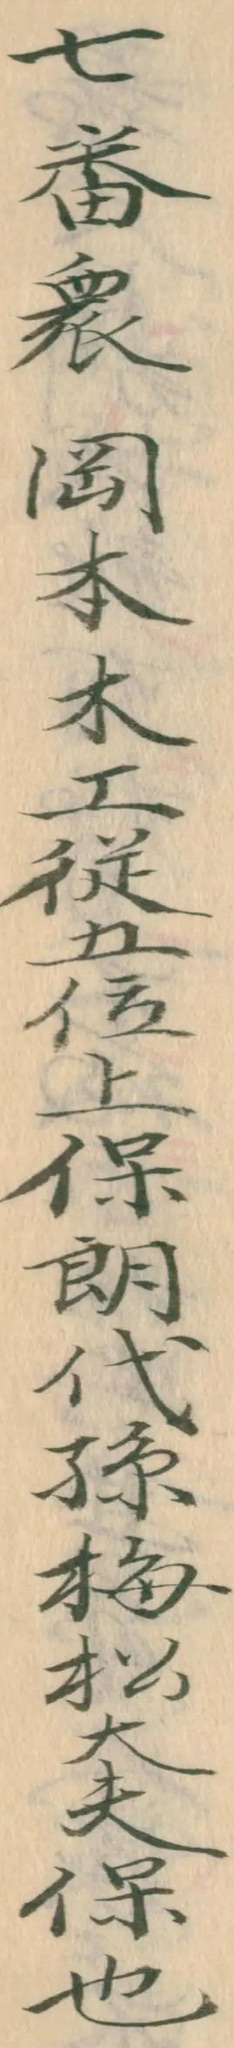七番衆岡本木工従五位上保朗代孫梅松大夫保也
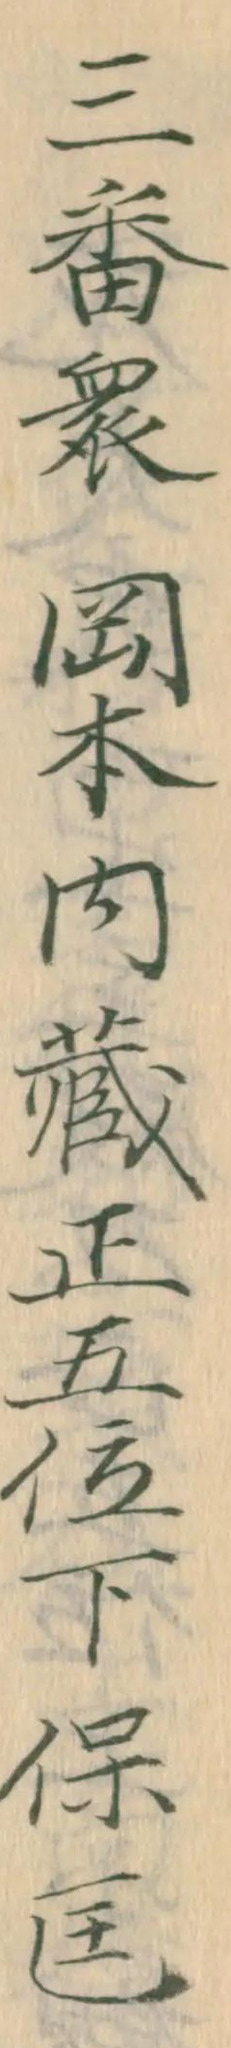三番衆岡本内蔵正五位下保匡
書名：賀茂社記録. 第15冊
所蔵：国立国会図書館 National Diet Library, JAPAN
